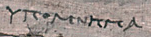υπομνημα
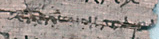ζηνωνιπαρααϲ
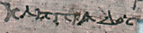κληπιαδοϲ
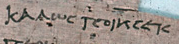καλωϲποιηϲειϲ
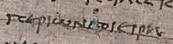περιωνϲοιειρη
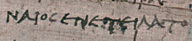ναιοϲενετειλατο
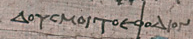δουϲμοιτοεφοδιον
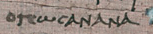οπωϲανανα
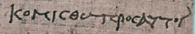κομιϲθωπροϲαυτον
